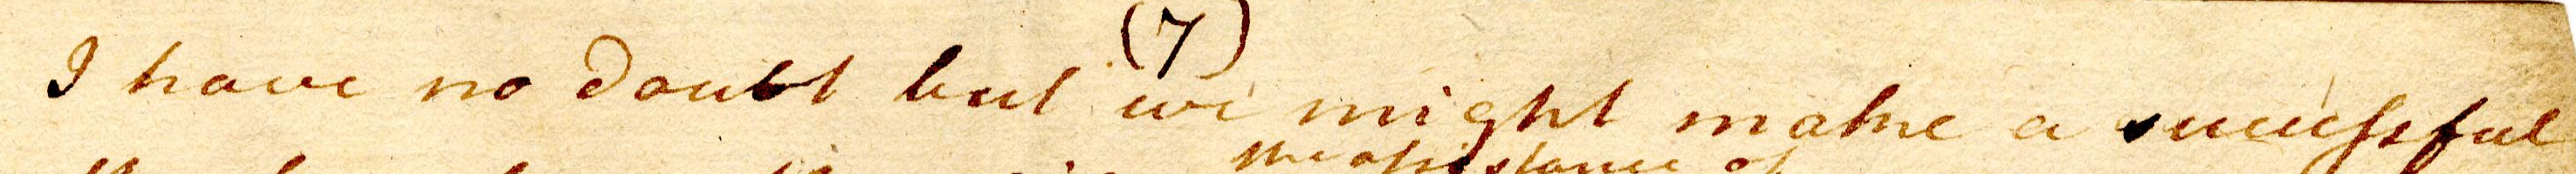I have no doubt but we might make a successful
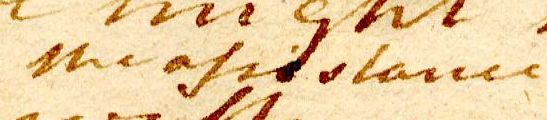the assistance
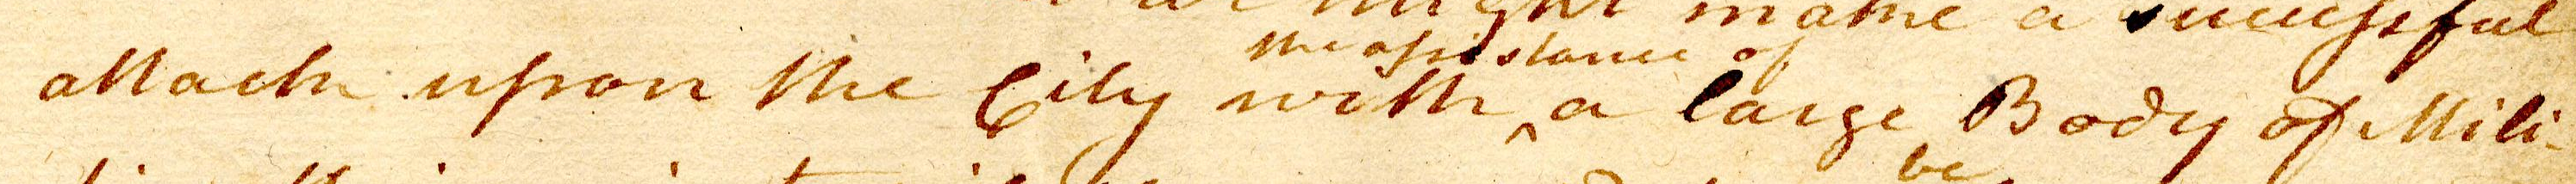attack upon the City with ^ a large Body of Mili-
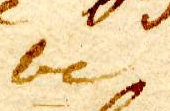be
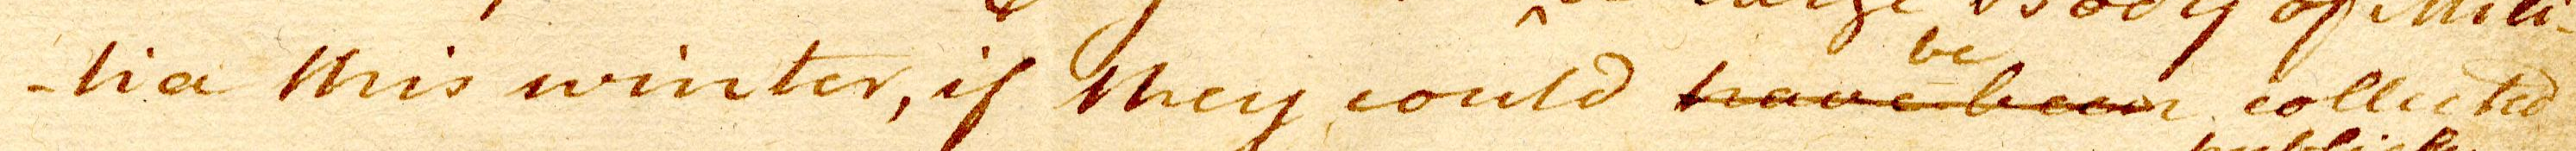-tia this winter, if they could [have been] collected
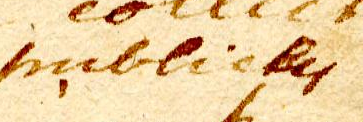publicly
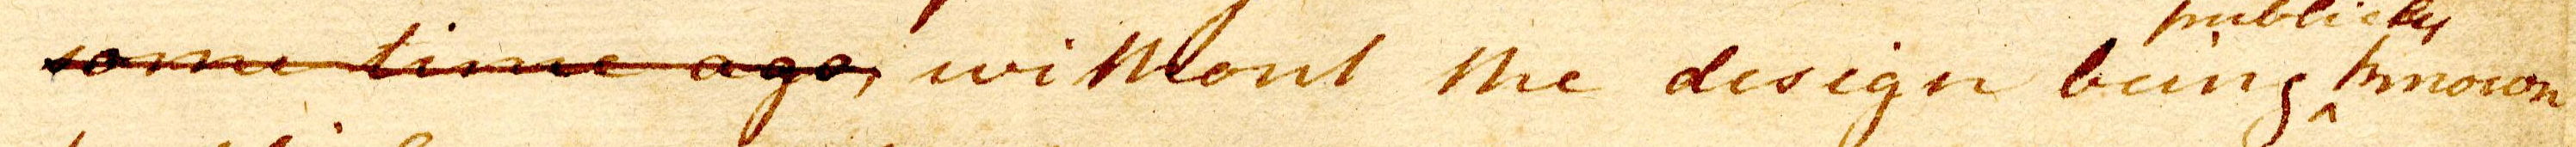[some time ago] without the design being ^ known
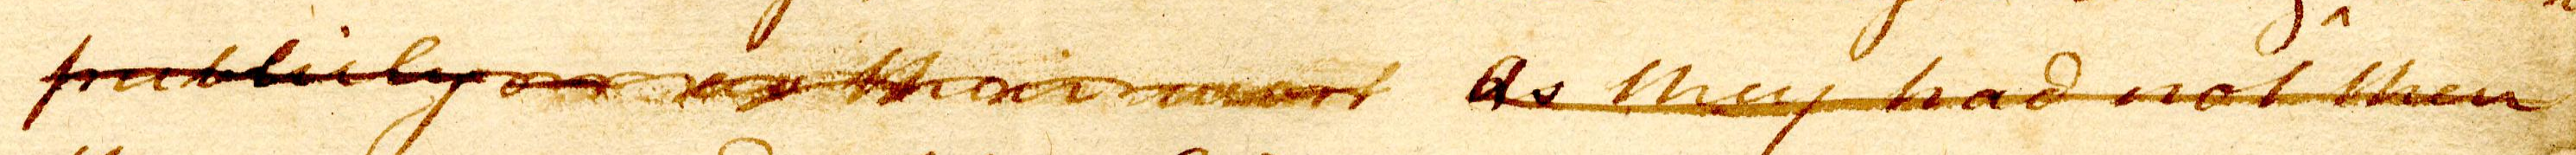[publicly on] [__________] [As they had not then]
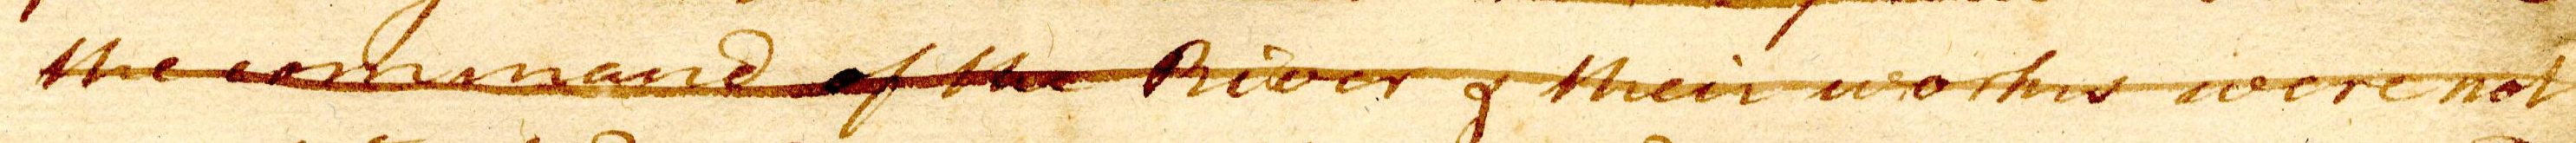[the command of the River & their works were not]
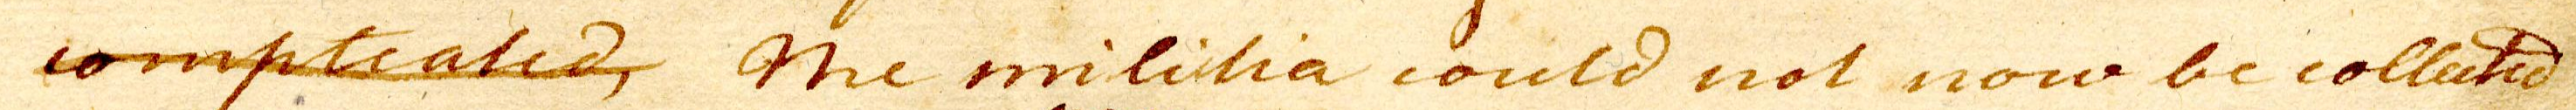[compleated,] the militia could not now be collected
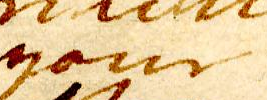your
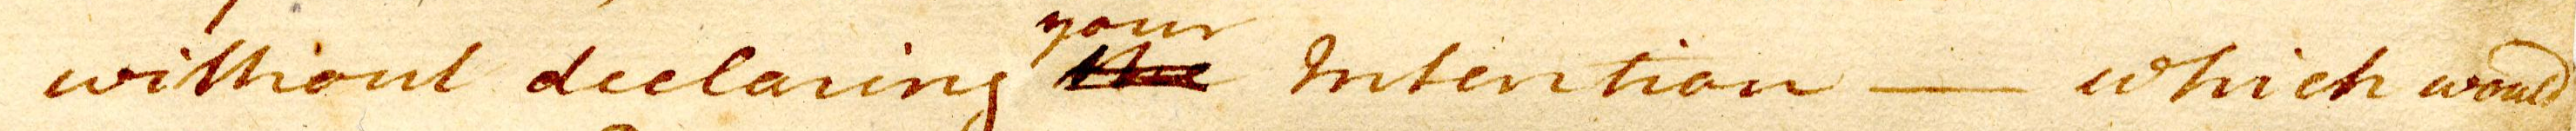without declaring [the] Intention- which would
